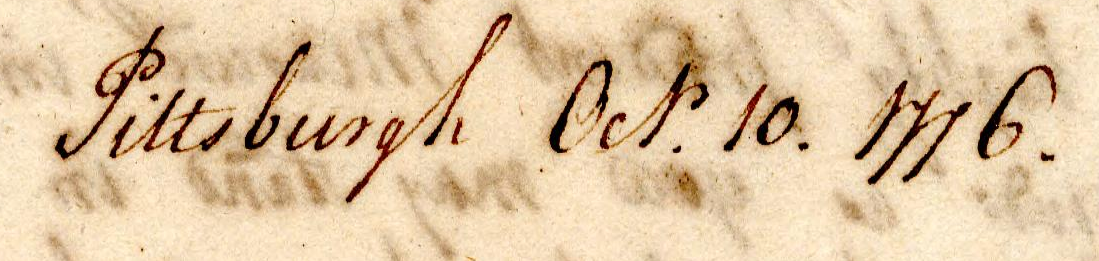Pittsburgh Oct^r. 10. 1776.
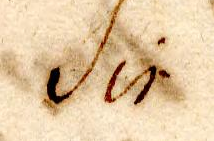Sir
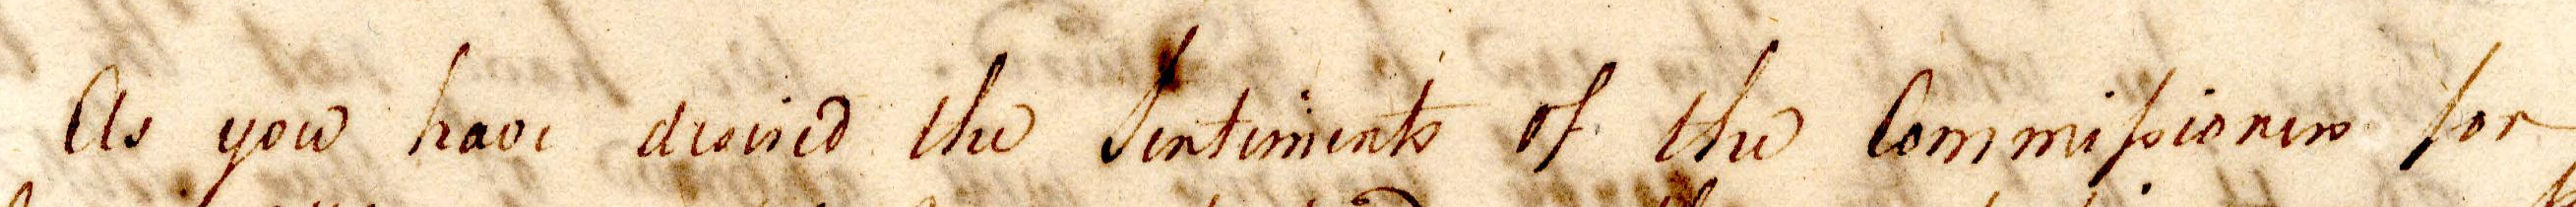As you have desired the Sentiments of the Commissioners for
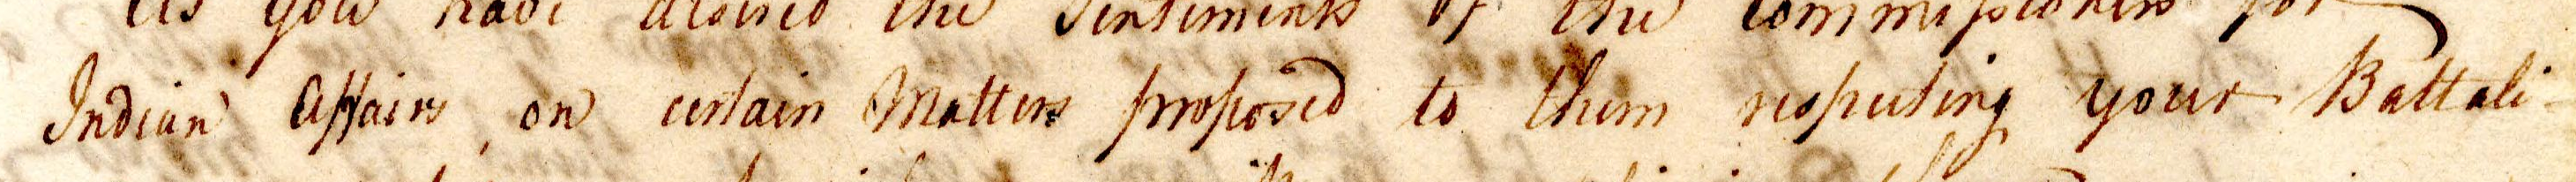Indian Affairs, on certain Matters proposed to them respecting your Battali
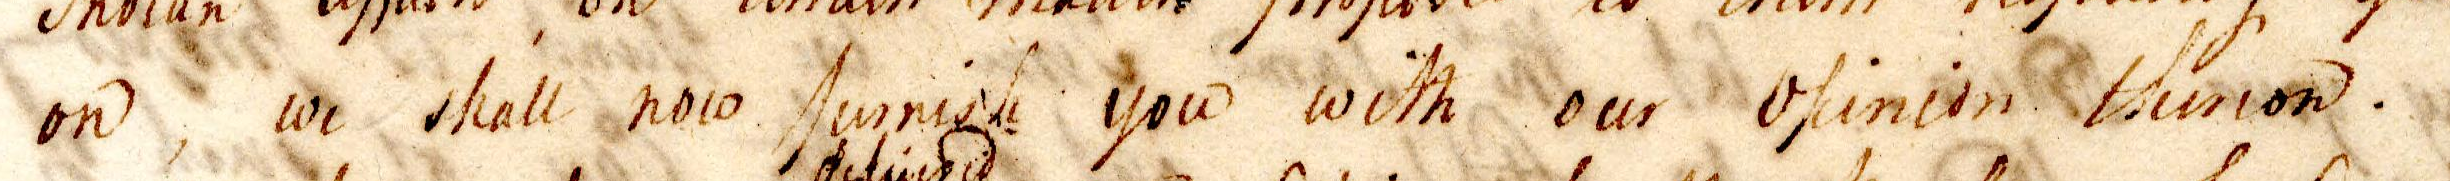on, we shall now furnish you with our opinion thereon.
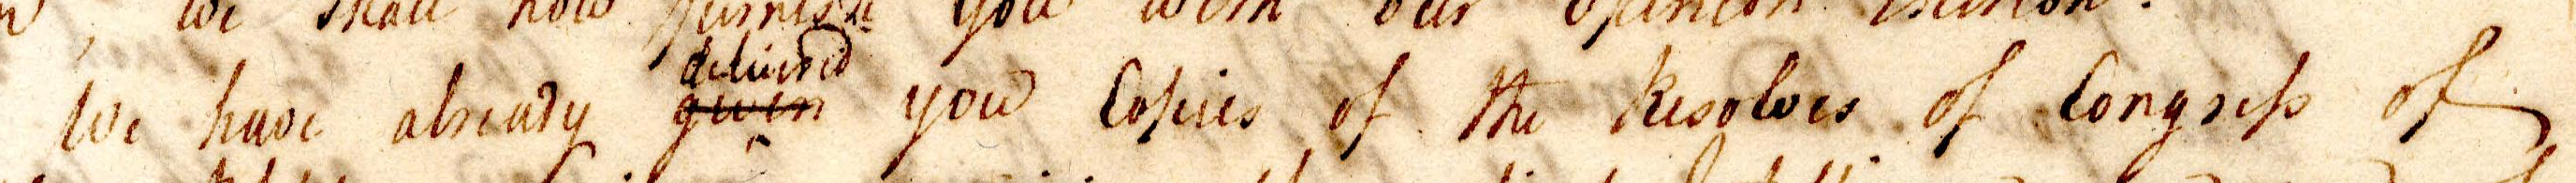We have already given ^ you Copies of the Resolves of Congress of
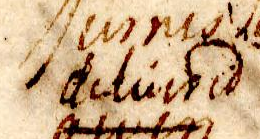delivered
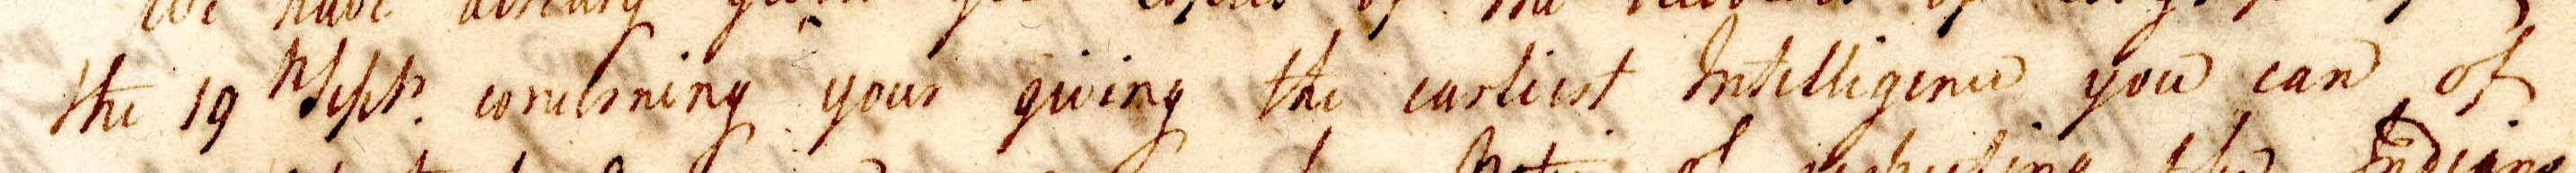the 19^th Sept. concerning your giving the earliest Intelligence you can of
